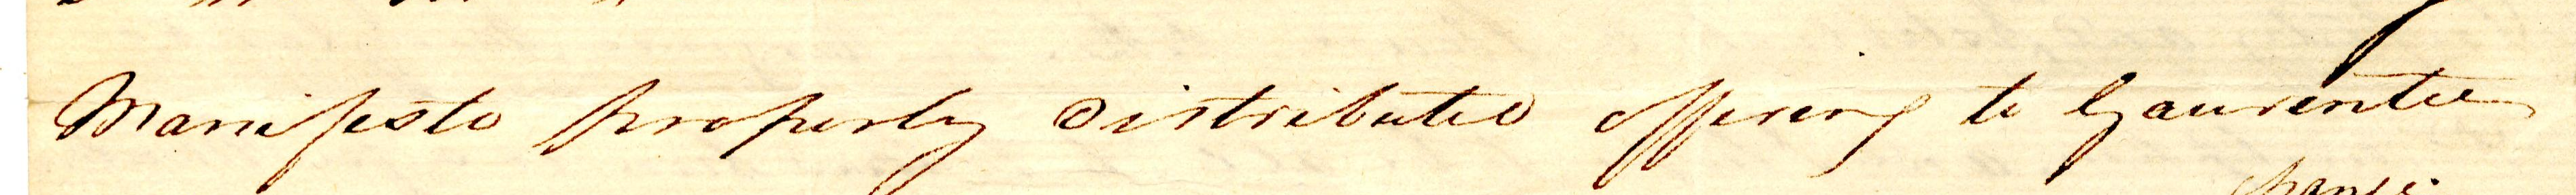Manifesto properly distributed offering to Gaurentee
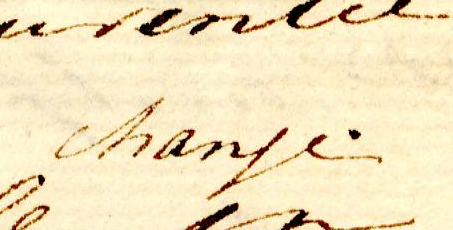change
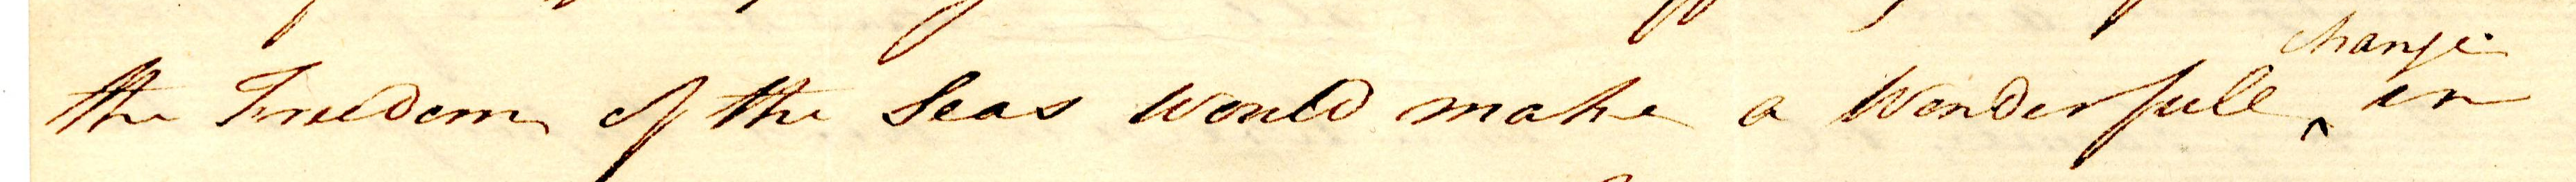the Freedom of the seas would make a Wonderful ^ in
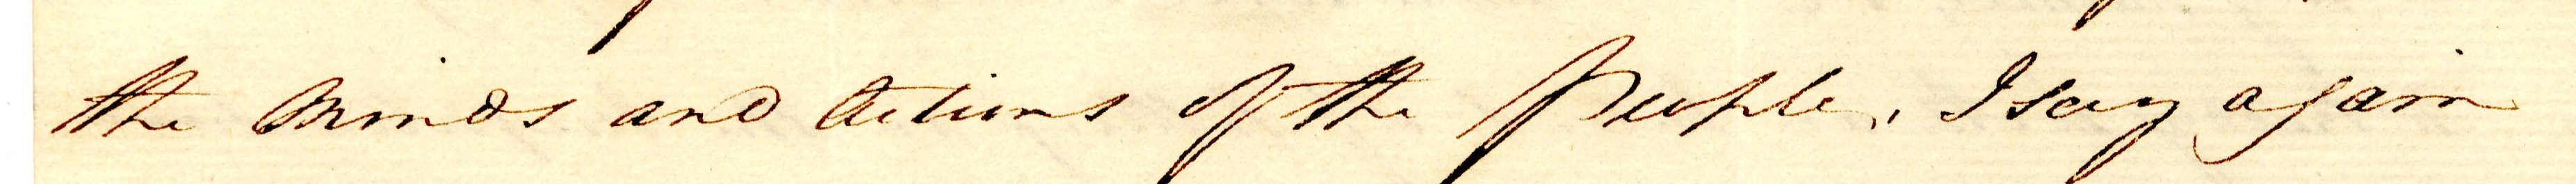the Minds and Actions of the People. I say again
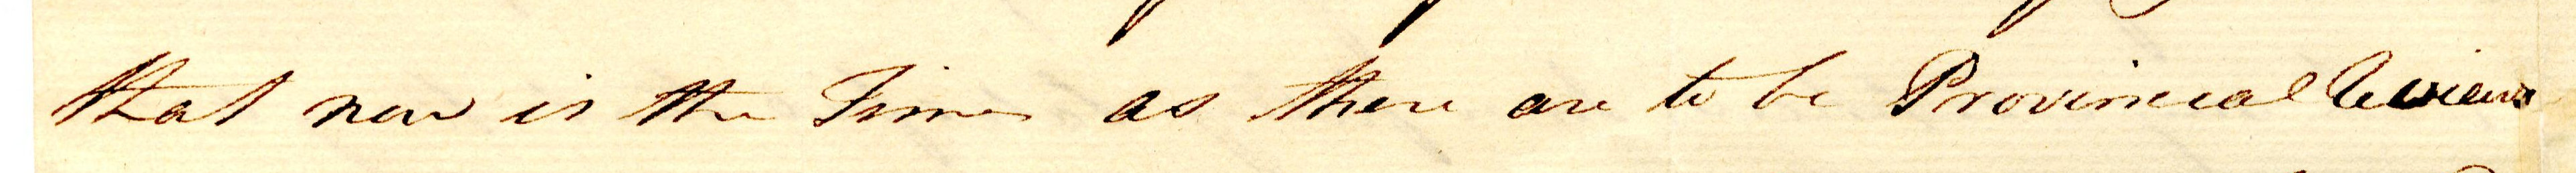that now in the Time as there are to be Provincial reviews
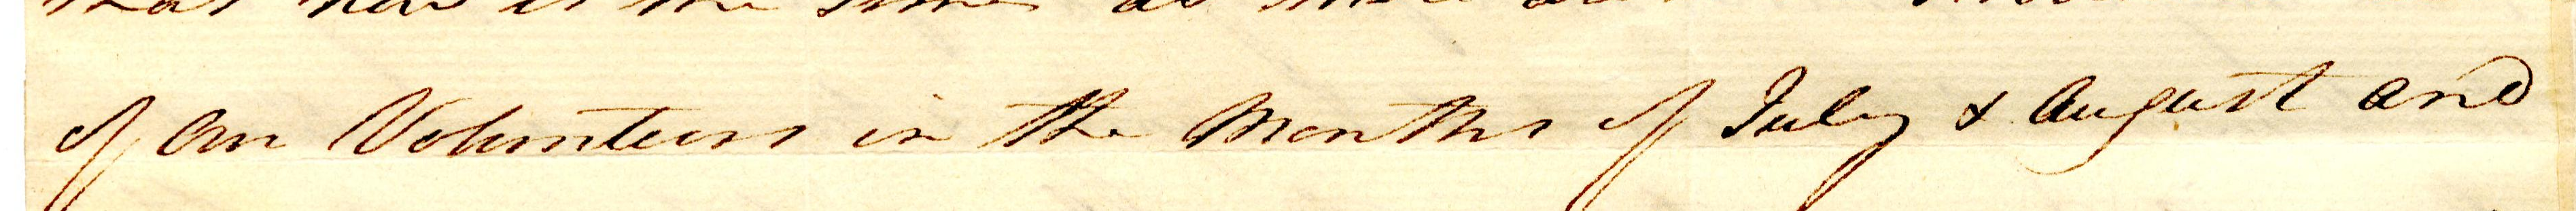of our Volunteers in the months of July & August and
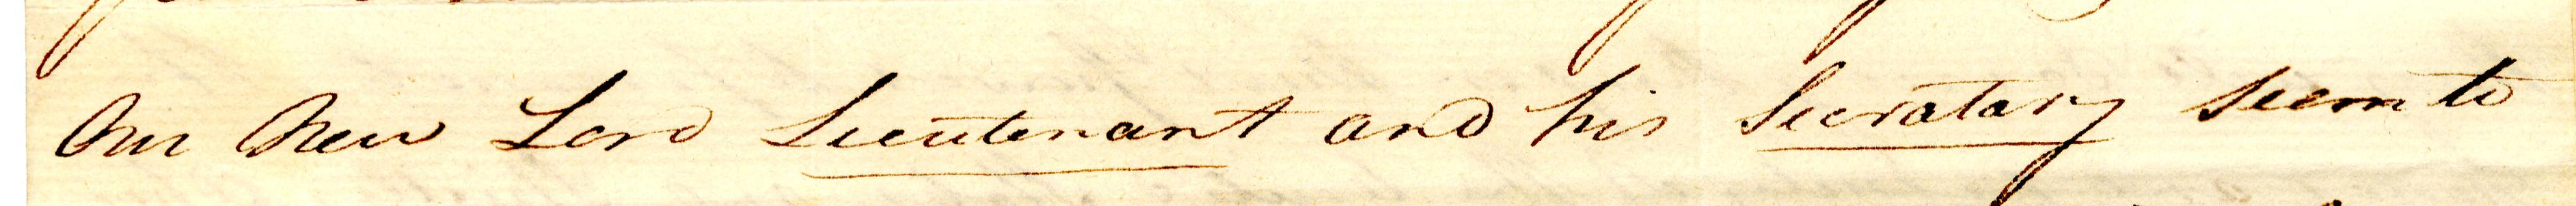Our New Lord Lieutenant and his Secretary seem to
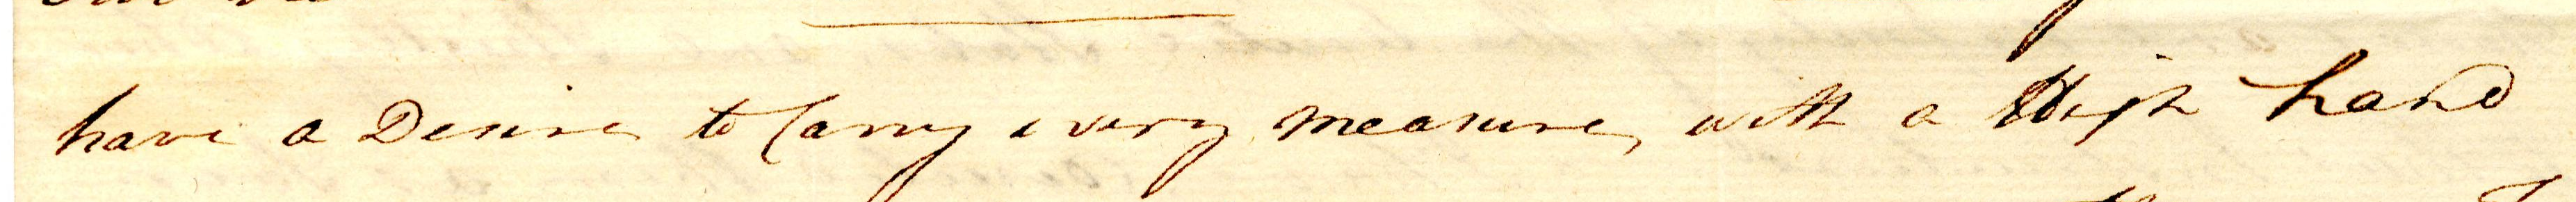have a Desire to Carry every measure with a High hand
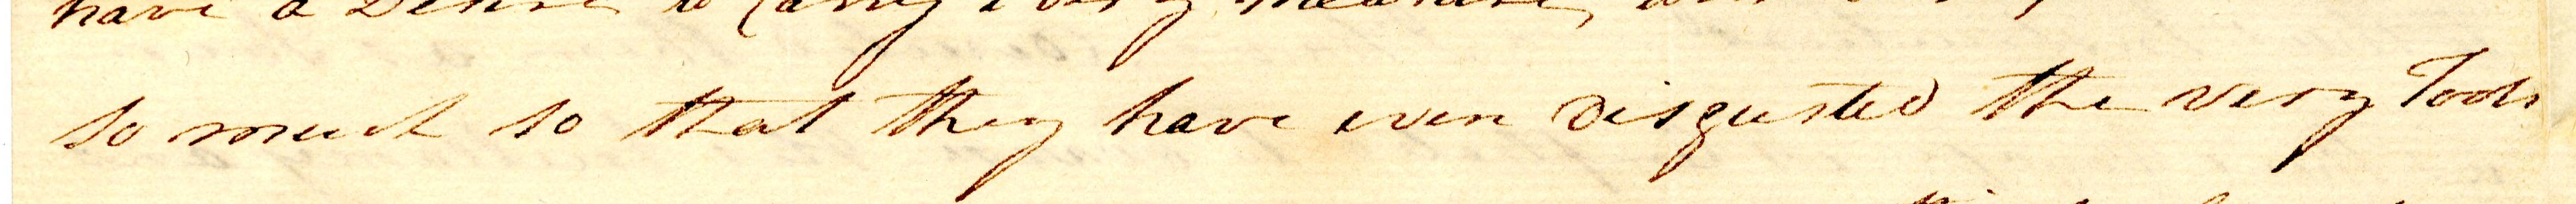so much so that they have even disgusted the very Tools
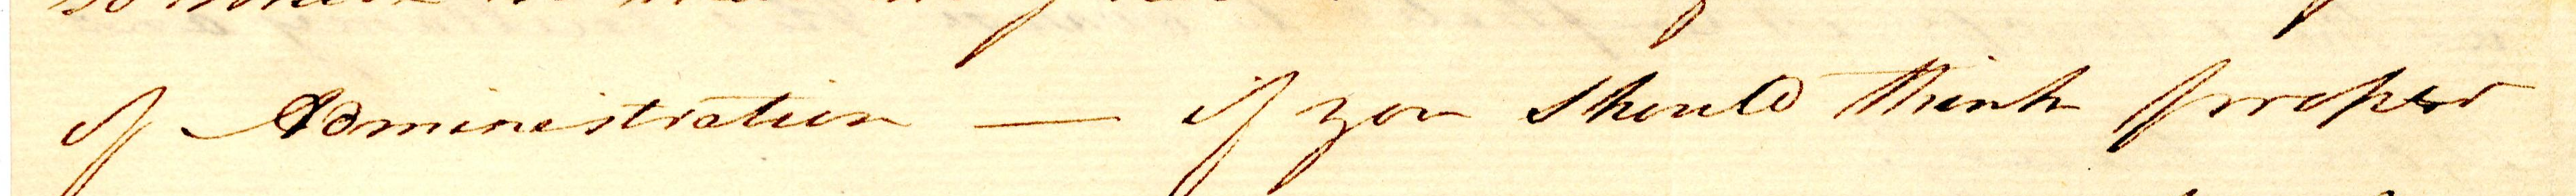of Administration- if you should think proper
